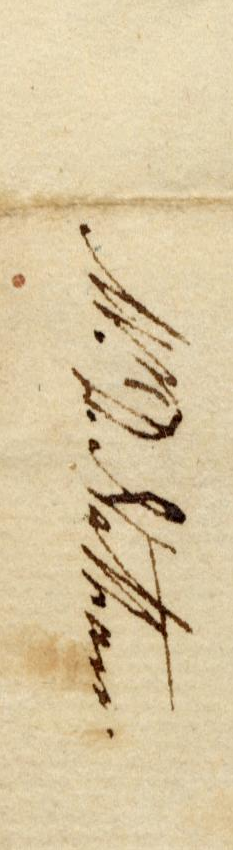M^r. D. Nathan
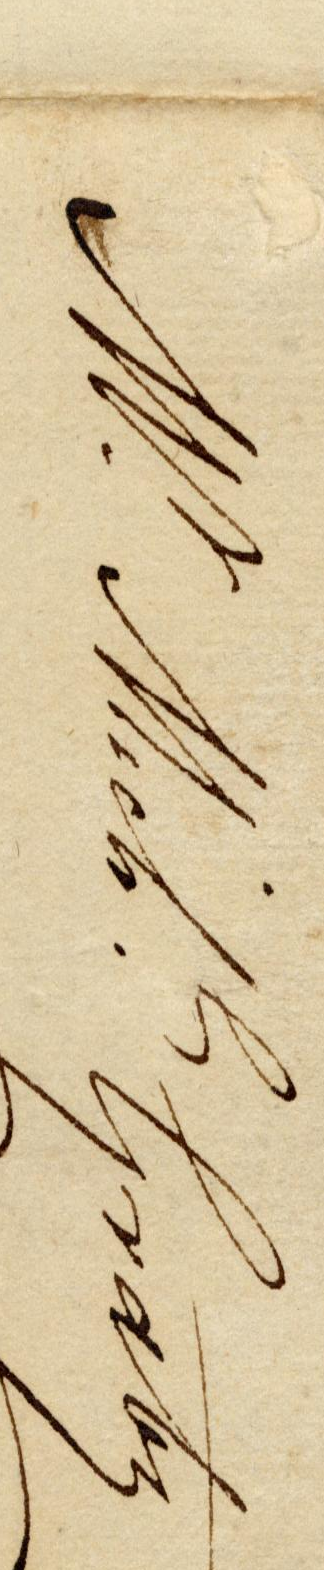M^r. Mich^l. Gratz
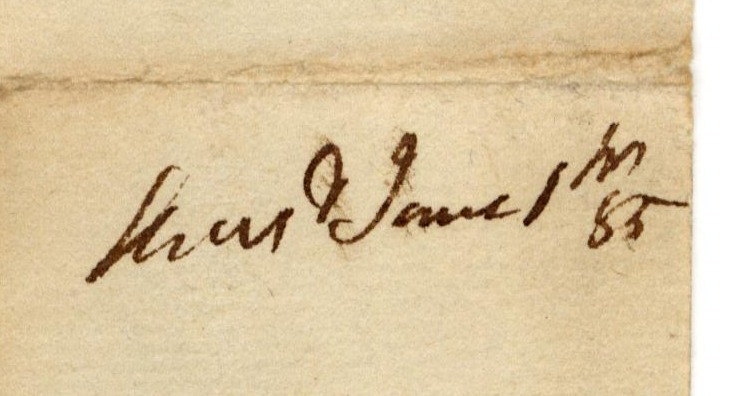Hand James M 85
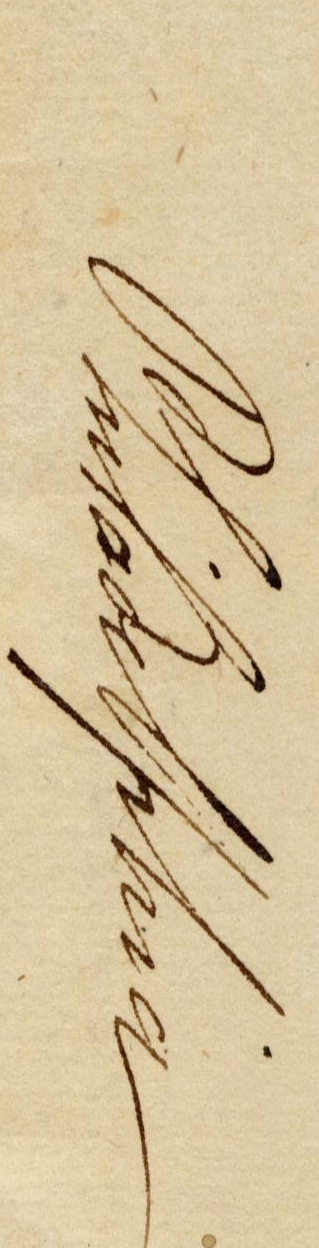Philadelphia
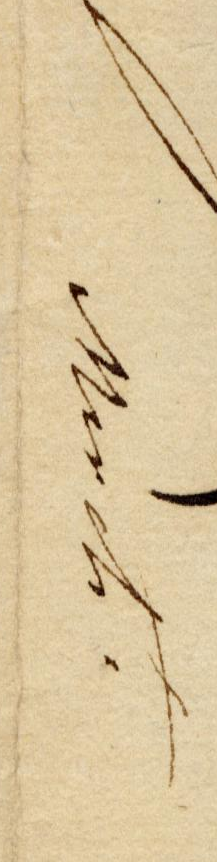Merch^t
